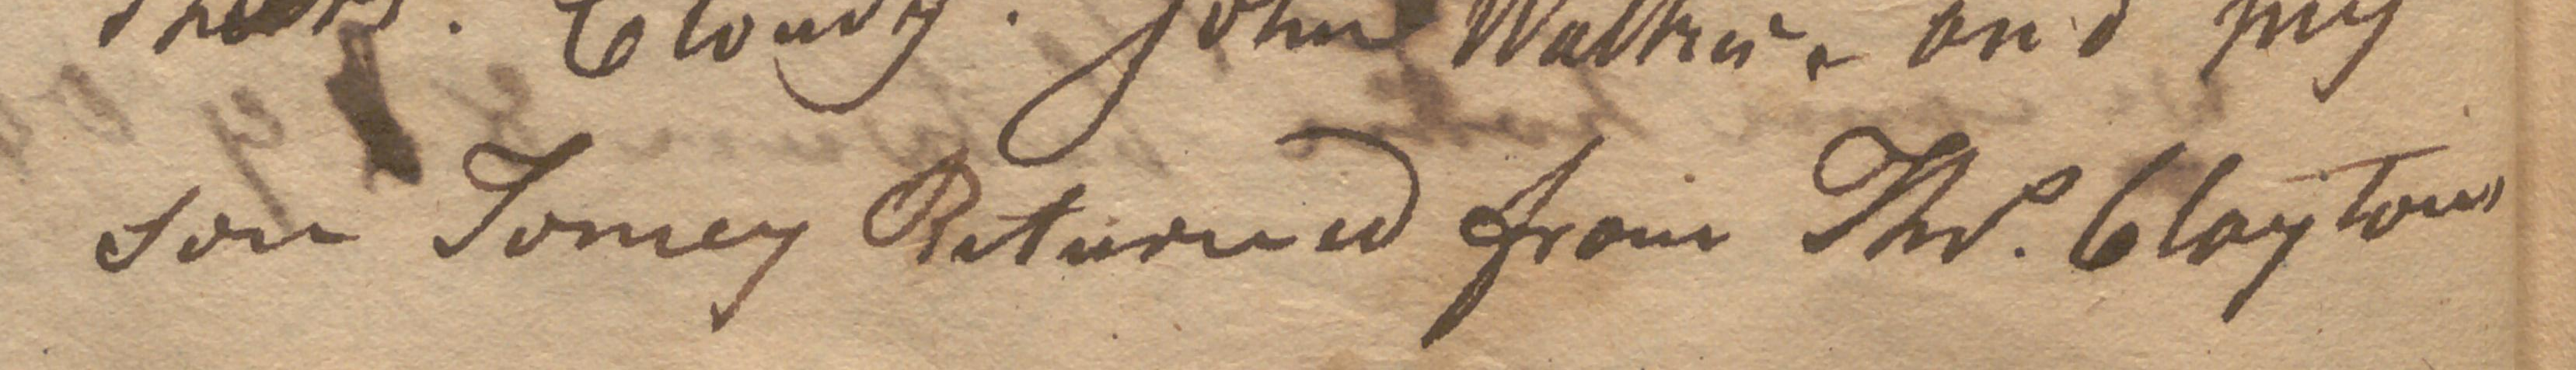sor Tomey Returned from Tho^s. Claytons
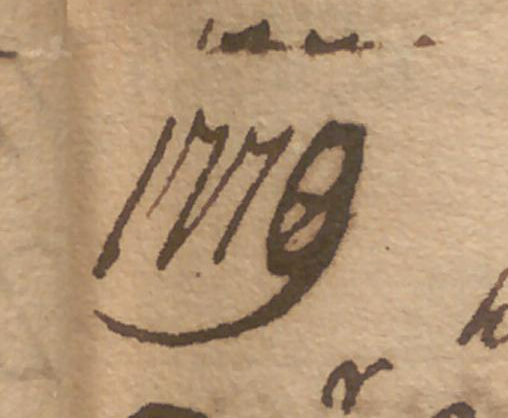1779
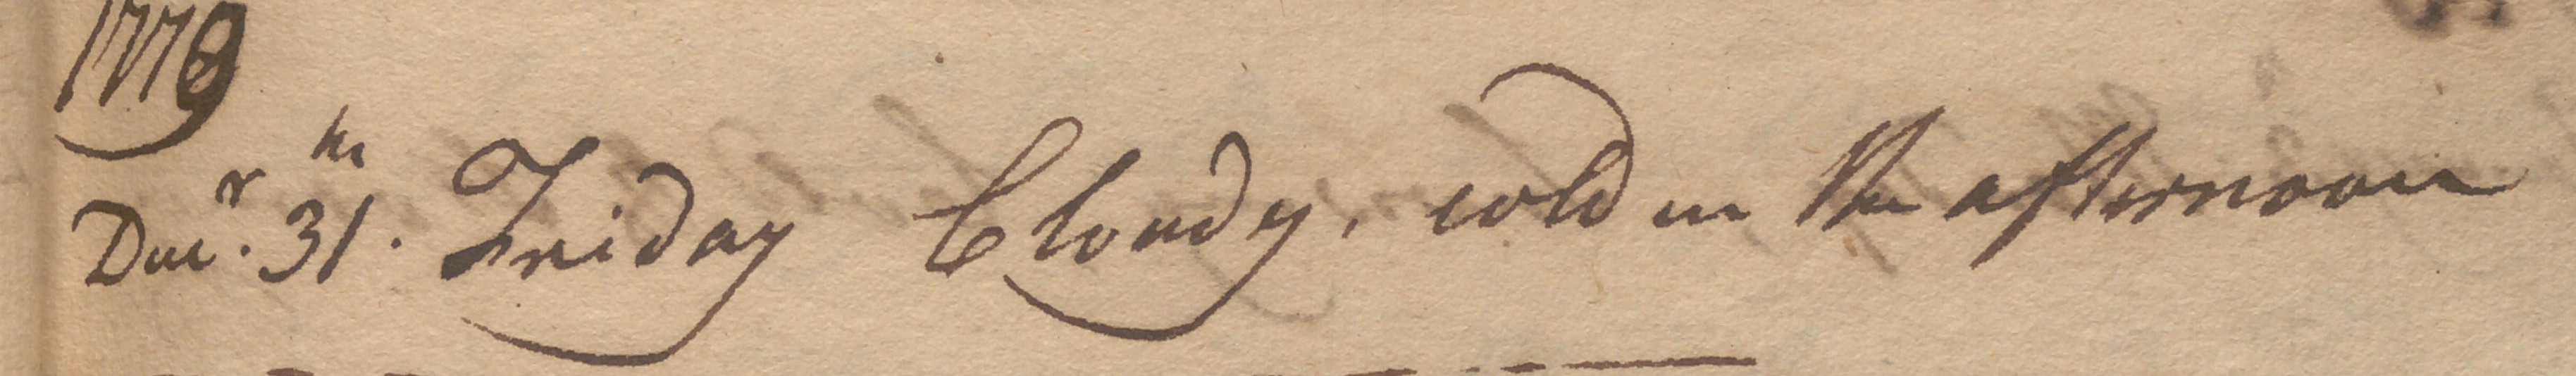Dec^r. 31^th. Friday Cloudy. cold in the afternoon
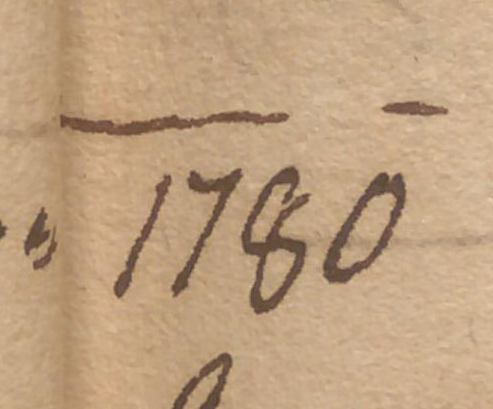1780
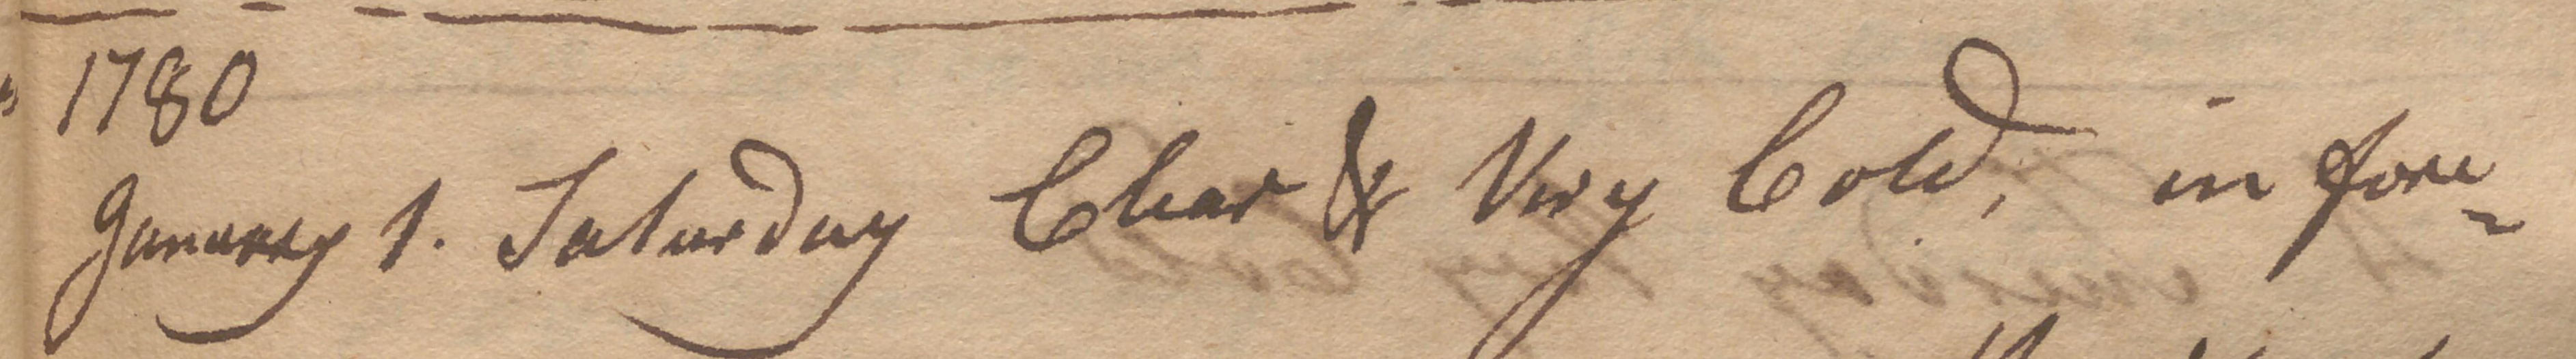January 1. Saturday Clear & Very Cold, in fore
